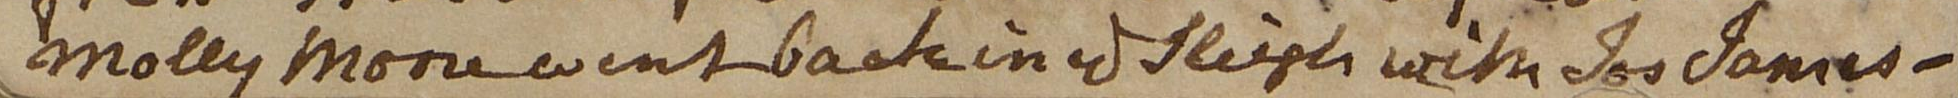Molly Moore event back in y^e Sleigh with Jos James-
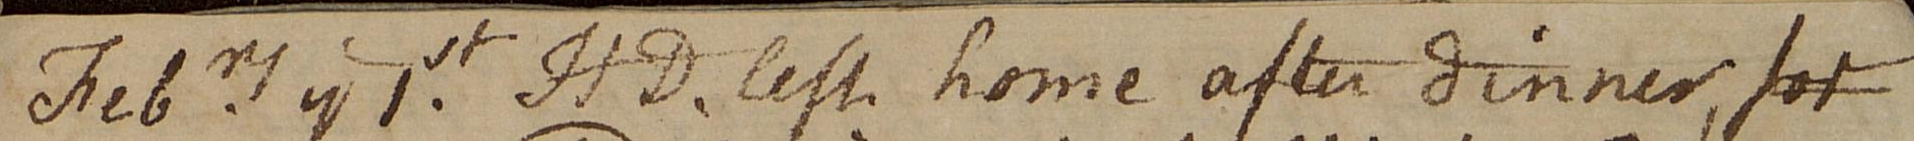Feb^ry. y^e 1^st. HD. left home after dinner for
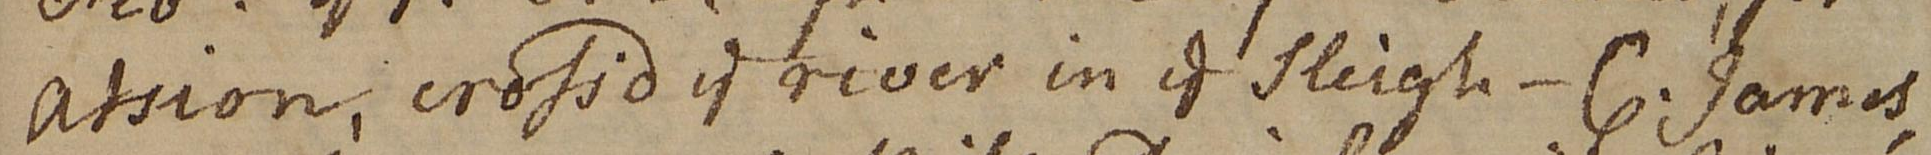Atsion, cross'd y^e river in y^e sleigh- C. James,
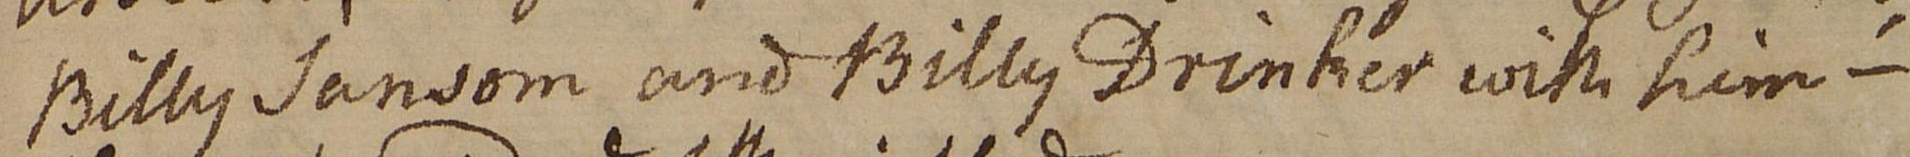Billy Sansom and Billy Drinker with him-
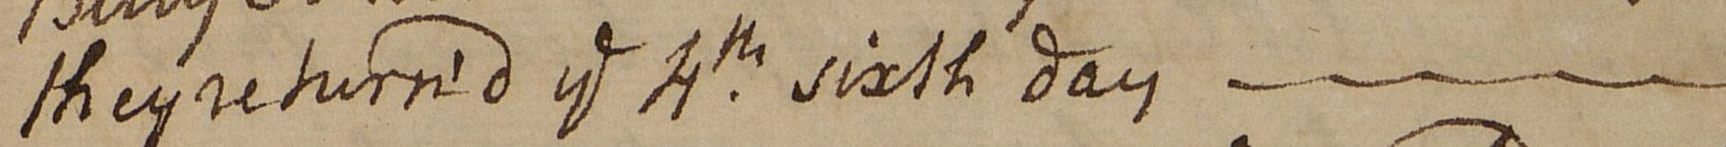they return'd y^e 4^th. sixth day-
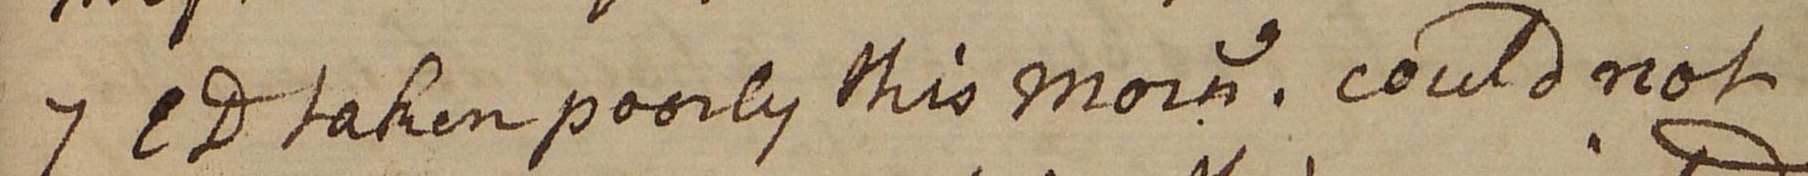7 ED taken poorly this morn^g. could not
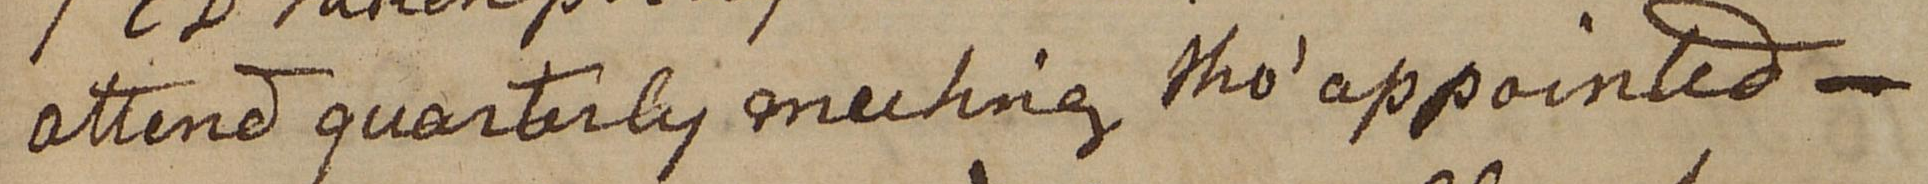attend quarterly meeting tho' appointed-
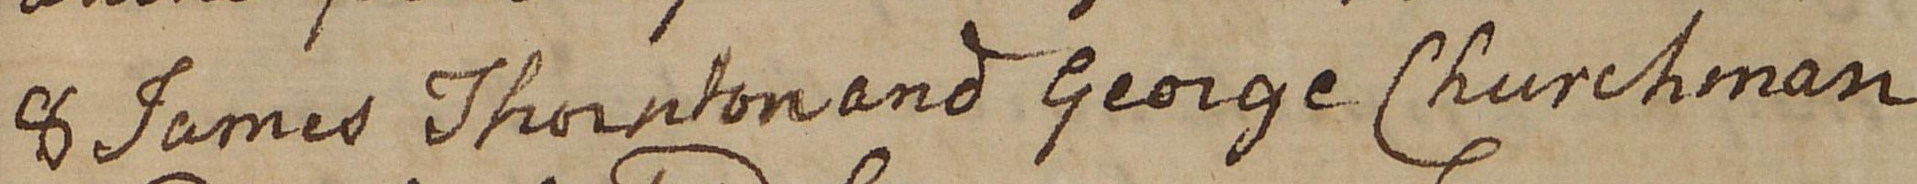8 James Thornton and George Churchman
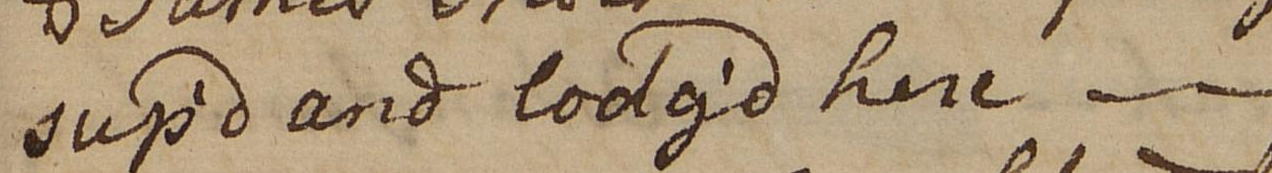sup'd and lodg'd here-
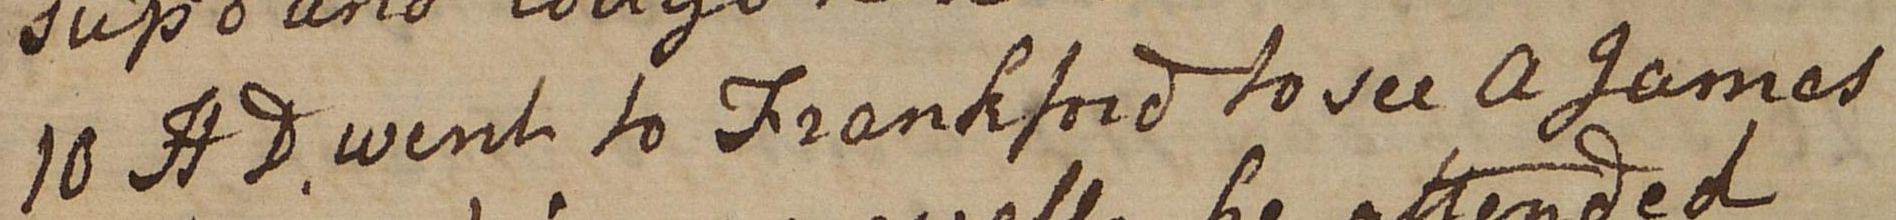10 HD went to Frankford to see A James
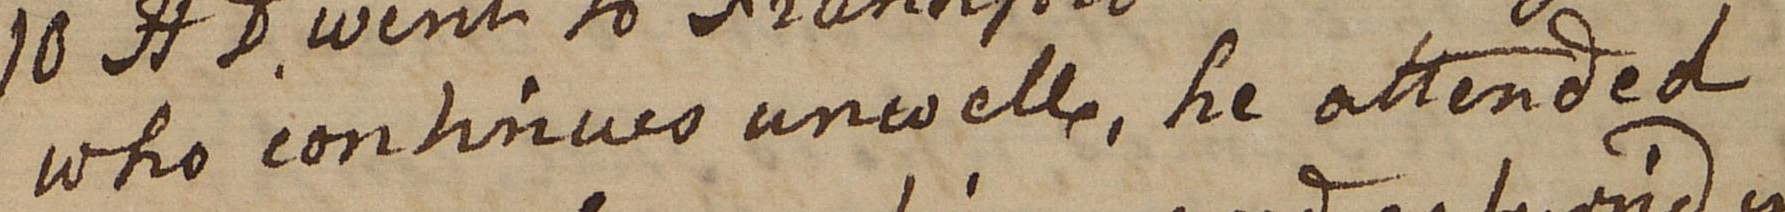who continues unwell, he attended
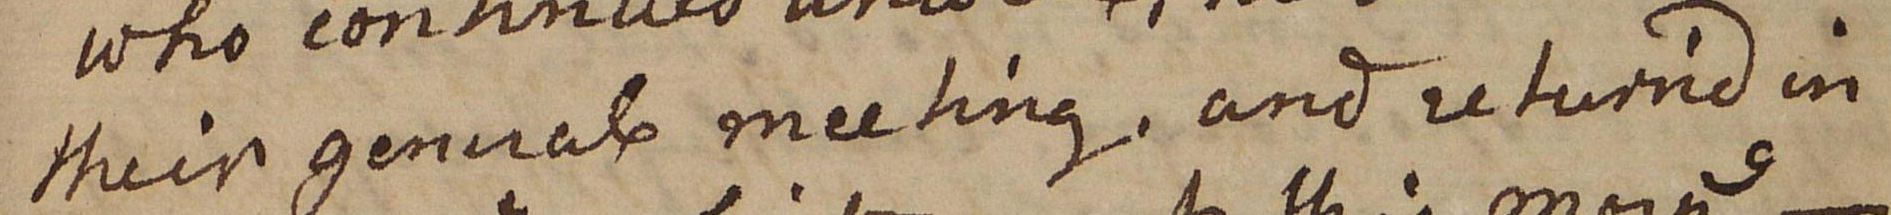their general meeting, and return'd in
